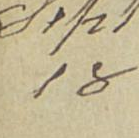18
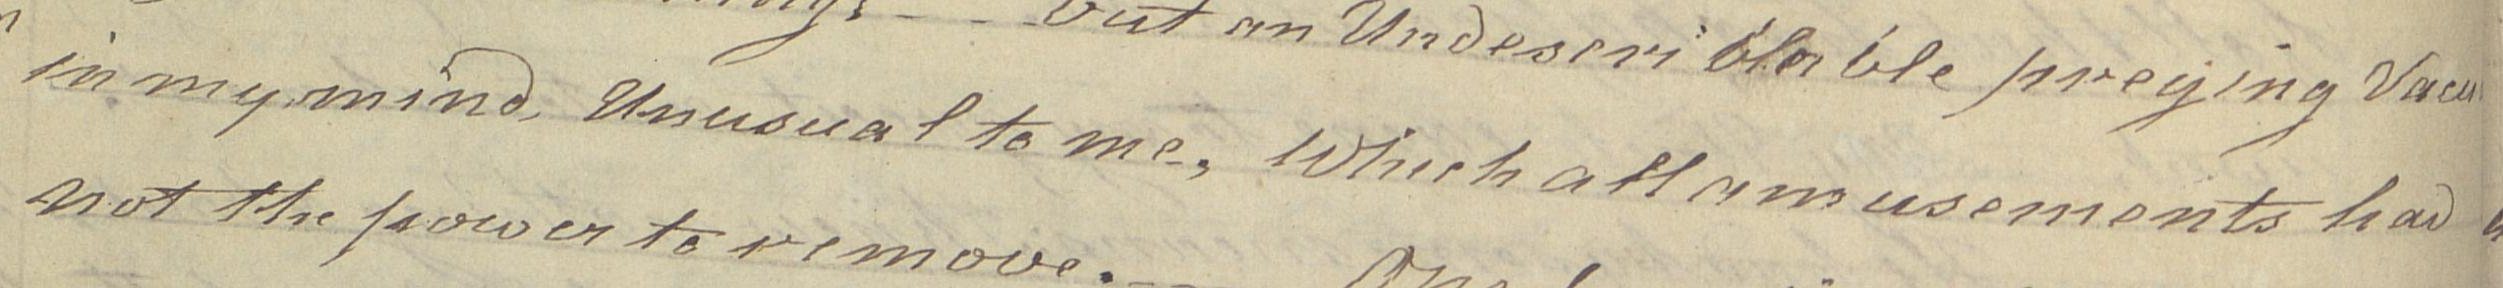in my mind unusual to me. Which all amusements had
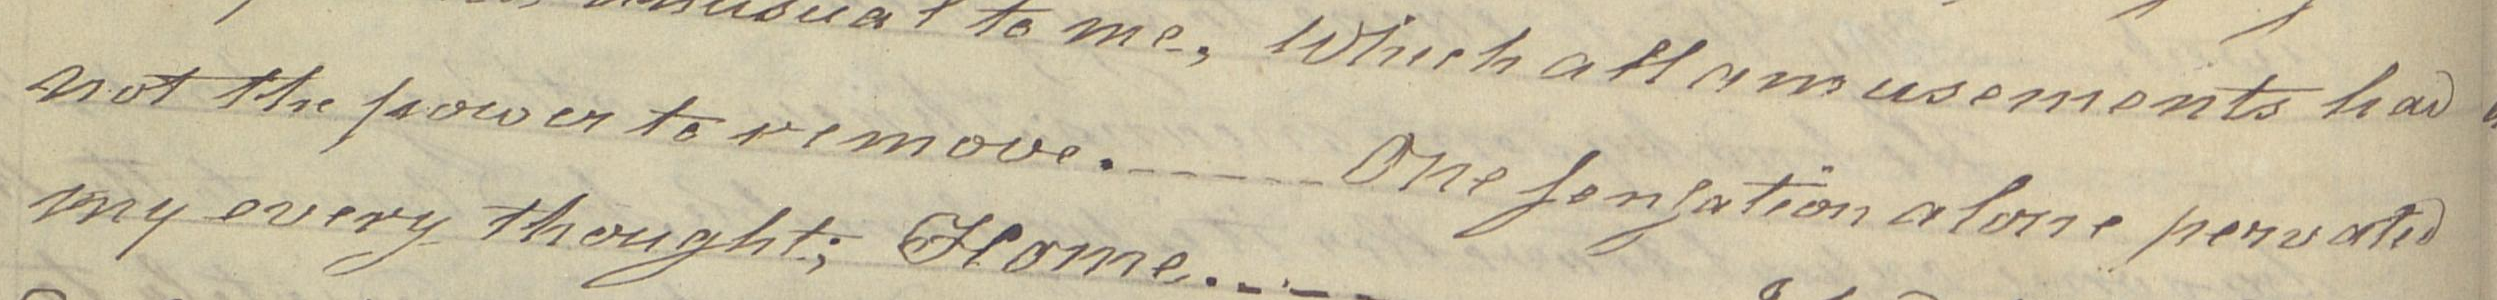not the power to remove. One sensation alone pervated
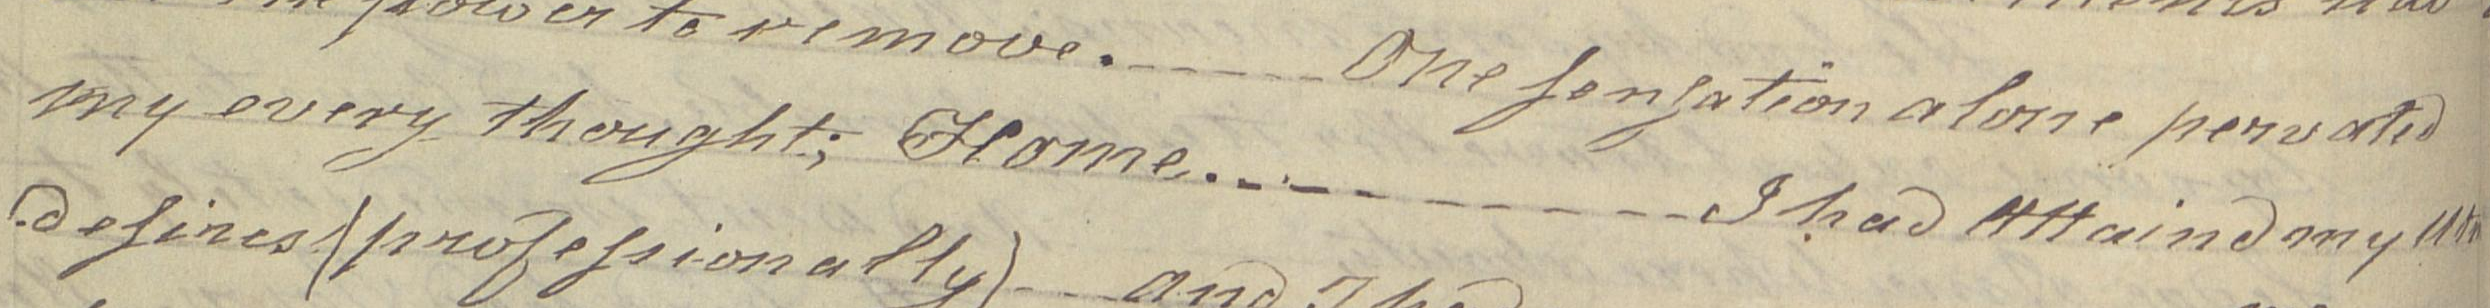my every thought; Home. I had attaind my [_]-
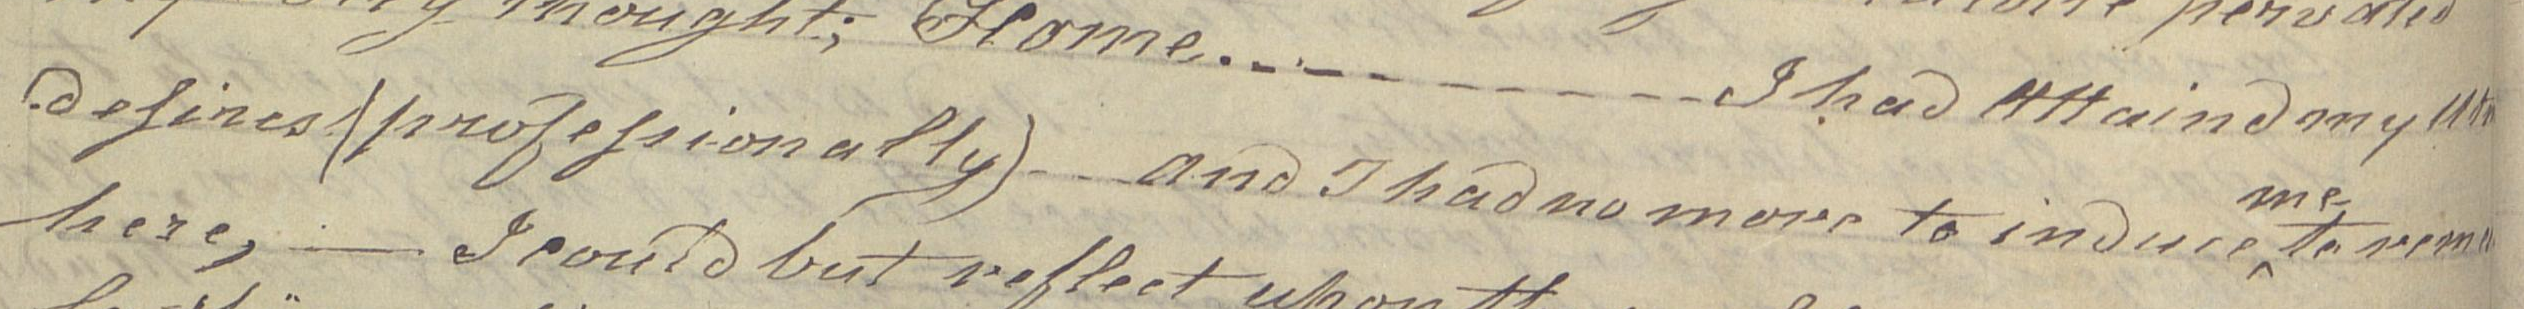desires (professionally) And I had no more to induce ^ to rem-
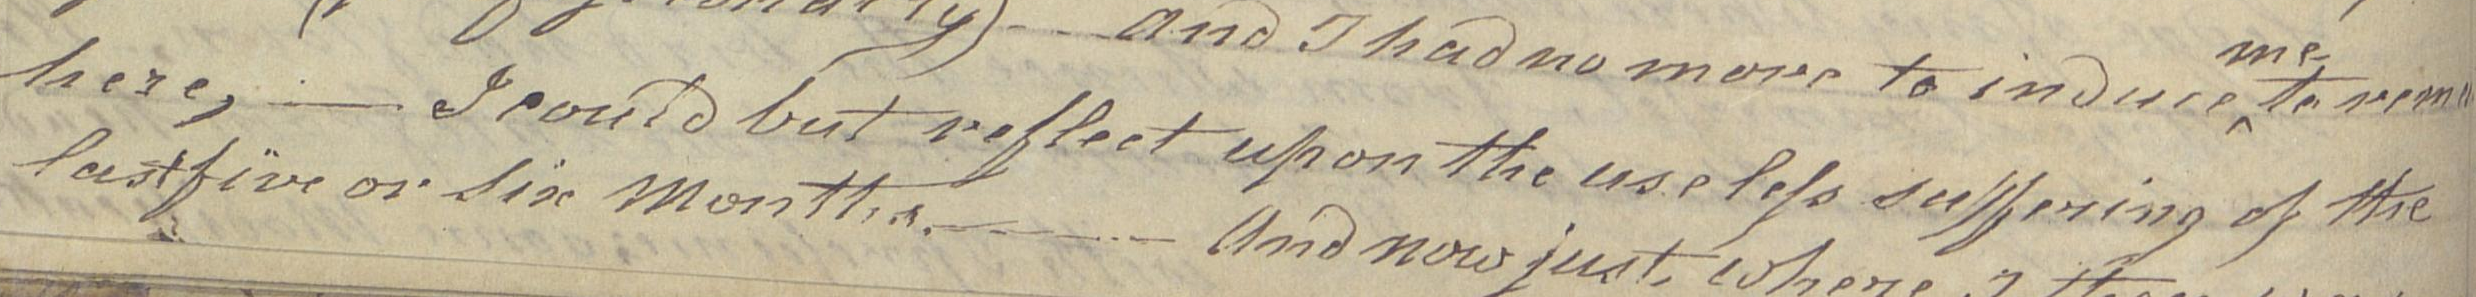here, I could but reflect upon the useless suffering of the
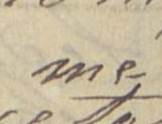me
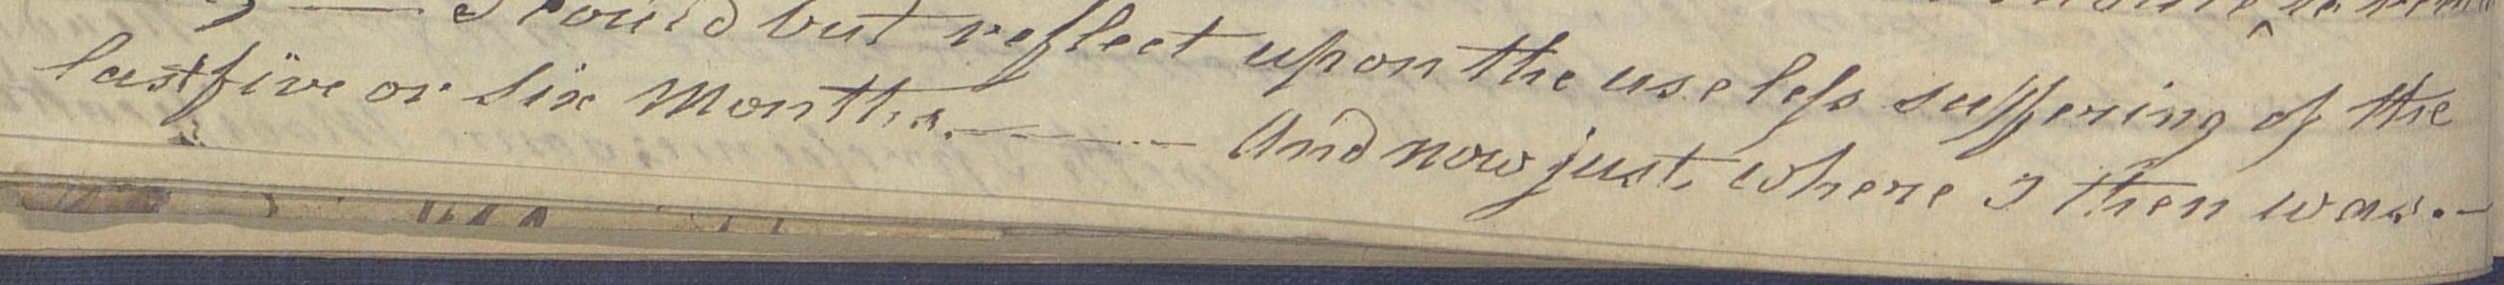last five or Six Months. And now just where I then was.
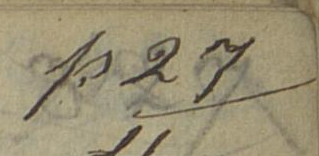p 27
